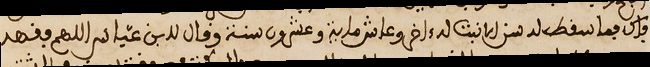فاك فما سقطت له سن الا نبت له ءاخرى وعاش ماية وعشرون سنة وقال لابن عبّاس اللهم فقهه
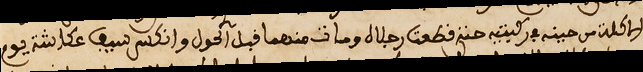الاكلة من حينه في ركبتيه حتى قطعت رجلاه ومات منهما قبل الحول وانكسر سيف عكاشة يوم
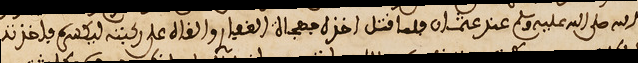الله صلى الله عليه وسلم عند عثمان فلما قتل اخذه جهجاة الغفارى والقاه على ركبته ليكسره فاخذته
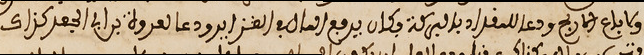ولا باع الا ربح ودعا للمقداد بالبركة فكان يرفع المال في الغزاير دعا لعروة بن ابى الجعد كذا
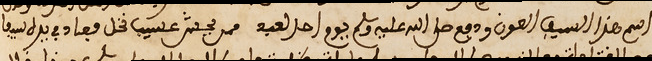اسم هذا السيف العون ودفع صلى الله عليه وسلم يوم احد لعبد بن جحش عسيب نخل فعادد في يده سيفا
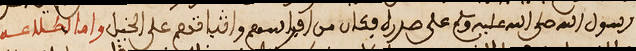رسول الله صلى الله عليه وسلم على صدره فكان من افراسهم واثباتهم على الخيب واما اطلاعه
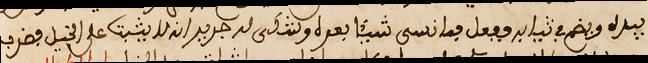بيده ويضم في ثيابه ففعل فما نسى شيئا بعده وشكى له جرير انه لا يثبت على الخيل فضرب
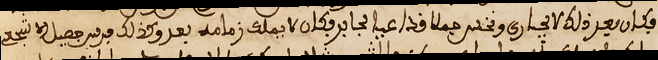فكان بعد ذلك لا يجازى ونخس جملا قد اعيا لجابر فكان لا يملك زمامه بعد وكذلك فرس جعيل الاشجعى
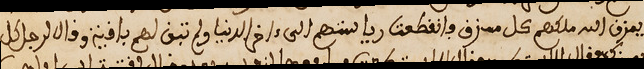يمزق الله ملكهم كل ممزق فانقطعت رياستهم الى ءاخر الدنيا ولم تبق لهم باقية وقال لرجل كل
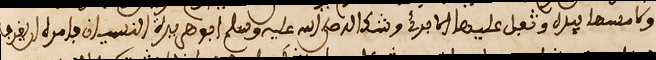ولا مسها بيده وثفل عليها الا برئ وشكا له صلى الله عليه وسلم ابو هريرة النسيان فامره ان يغرف
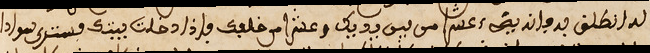له انطلق به فانه يضىء عشرا من بين يديك وعشرا من خلفك فاذا دخلت بيتك فسترى سوادا
